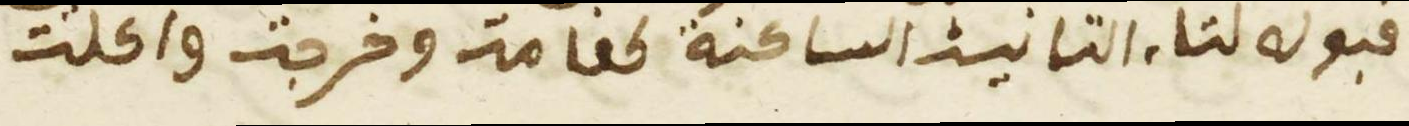قبوله لتاء الثانيت الساكنة كقامت وخرجت واكلت
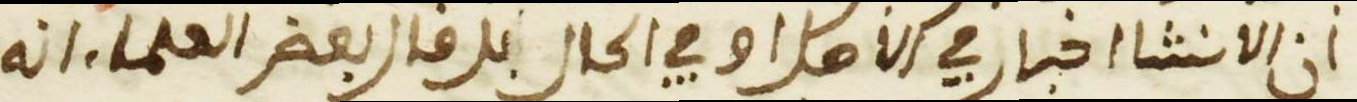ان الانشاء اخبار في الاصل وفي الحال بل قال بعض العلماء انه
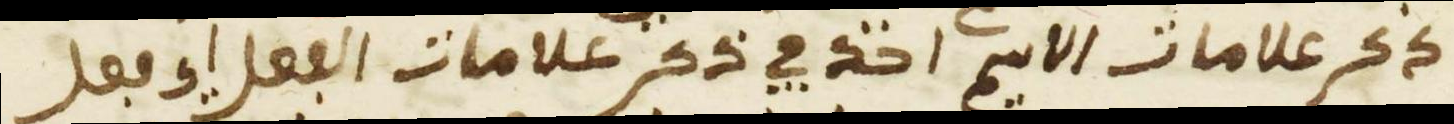ذكر علامات الاسم احد في ذكر علامات الفعل أي فعل
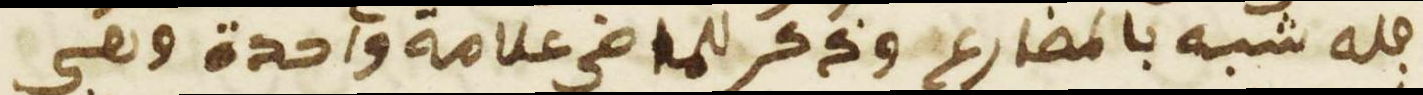فله شبه بالمضارع وذكر للماضي علامة واحدة وهي
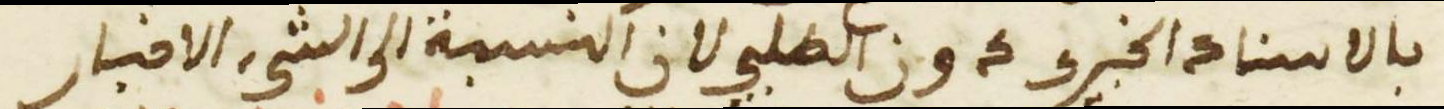بالاسناد الخبري دون الطلبي لان النسبة الى الشىء الاخبار
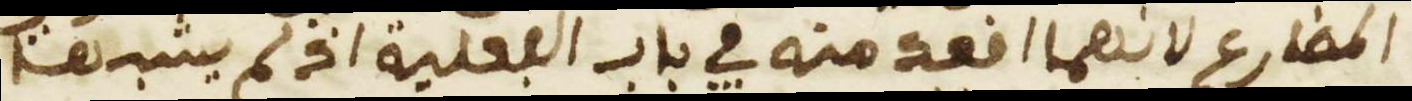المضارع لانهما اقعد منه في باب الفعلية اذ لم يشبها
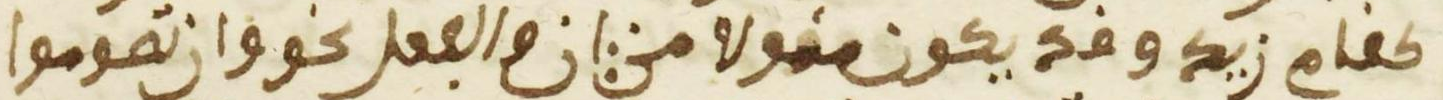كقام زيد وقد يكون مقولا من ان والفعل نحو وان تصوموا
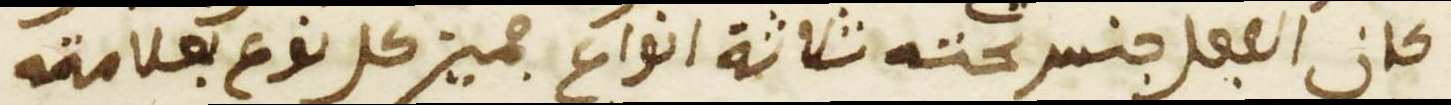كان الفعل جنسه تحته ثلاثة انواع فميز كل نوع بعلامته
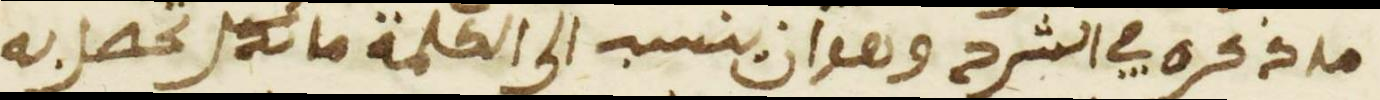ما ذكره في الشرح وهو ان ينسب الى الكلمة ما تدل تحصل به
